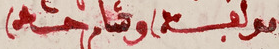مولفه و شارحه
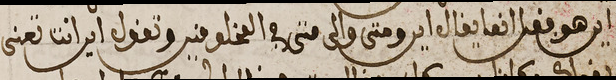اين هو فقل انما يقاله اين و متى و إلى متى من المخلوقين وتقول اين ان تعني
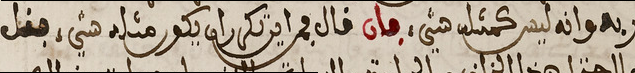ربه وانه ليس كمثله شيء فان قال فمن اين تكرر ان يكون مثله شيء فقل
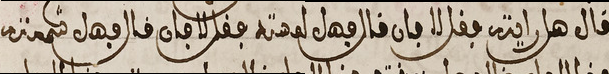قال هل رايت فقل لا فان قال فهل لمسته فقل لا فان قال فهل شممته
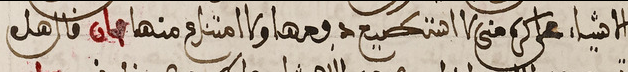الاشياء على كره منى لا استطيع دفعها ولا امتناع منها فان قال هل
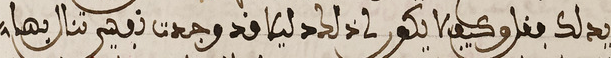يدلك فقل وكيف لا يكون لذلك دليلا قد وجدت نفسي تنال بها
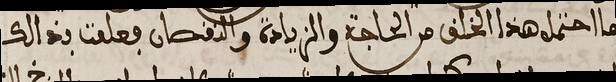ما احتمل هذا الخلق من الحاجة والزيادة والنقصان فعلت بذالك
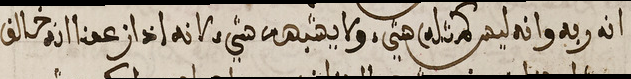انه ربه وانه ليس كمثله شيء ولا يشبهه شيءلانه اذا زعمنا انه خالق
